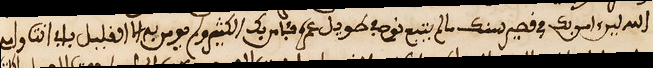الله لين ءامن بك في قصير سنك ما لم يتبع نوح في طويل عمره فئامن بك الكثير ولم يومن به الا القليل بابى انت وامى
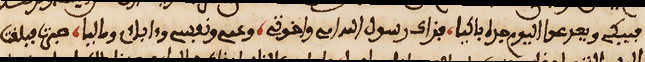فيبكى ويعدعوا اليوم جده باكيا فذاك رسول الله امى واخوتى وعمى نفسى وءاباءى وماليا صبرت فبلغت
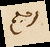رحيم
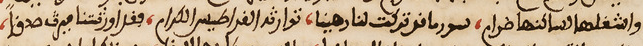واشغلها لساكنها ضرام سور ما قد تركت لنا ر#ينا توارثه القراطيس الكرام فقد او ثتنا ميرث صدقا
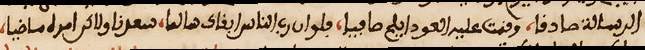الرسالة صادقا وقمت عليه العود ابلج صافيا فلو ان رب الناس ابقاك سالما سعدنا ولاكن امره ماضيا
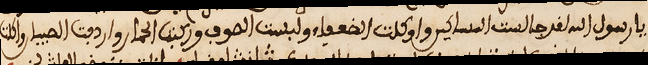يا رسول الله لقد جالست المساكين وا وكلت الضعفاء ولبست الصوف وركبت الحمار واردفت الصبيان واكلت
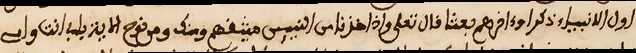اول الانبياء ذكرا وءاخرهم بعثا قال تعلى واذا اخذنا من النبيين ميثقهم ومنك ومن نوح الاية بابى انت وامى
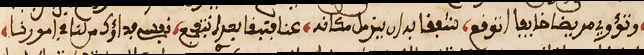وتؤوي مريضا خايفا اتوقع شفقا به ان يزمل مكانه عنا فنبقا بحده نتفجع نفسى فداؤك من لنا في امورنا
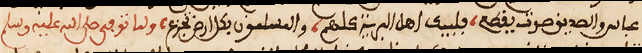عباس والصديق صوت يقطع فليبك اهل البرية كلهم والمسلمون بكل ارض تجزع ولما توفى صلى الله عليه وسلم
